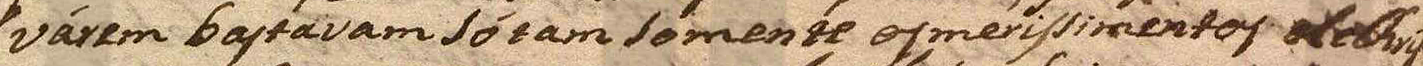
várem bastavam só tam somente os merissimentos de Chris
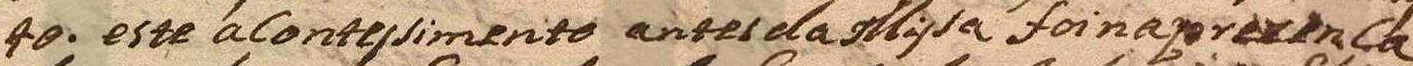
to. este aContessimento antes da Missa foi na prezenÇa
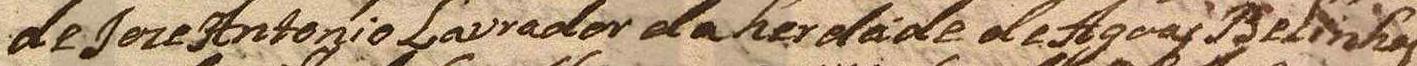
de Ioze Antonio Lavrador da herdáde de Agoas BeLinhas,
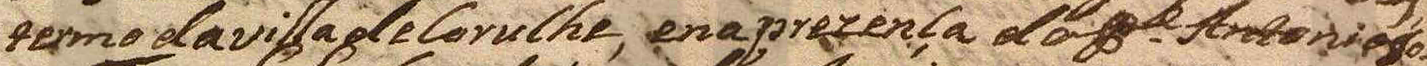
termo da villa de CoruChe, e na prezenÇa do P.e Antonio Jo
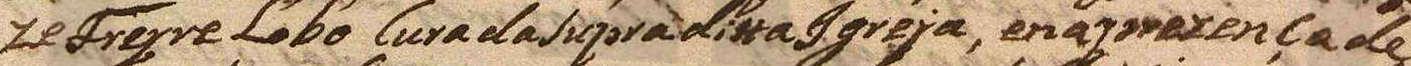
ze Freyre Lobo Cura da supraditta Jgreja, e na prezenÇa de
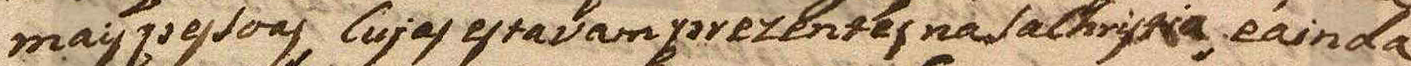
mais pessoas, Cujas estavam prezentes na saChristia, e ainda,
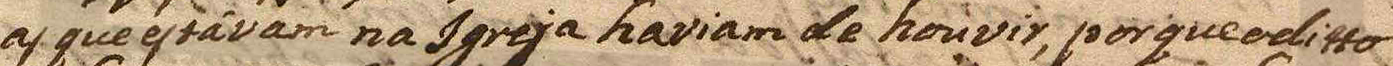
as que estávam na Igreja haviam de houvir, porque o ditto
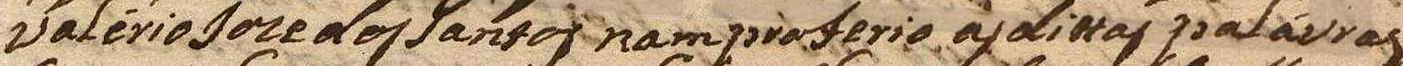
vaLério Ioze dos santos nam proferio as dittas paLávras
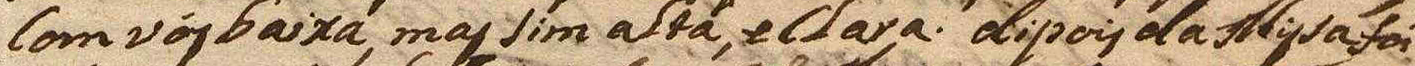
Com vós baixa, mas sim aLta, e Clara. dipois da Missa foi
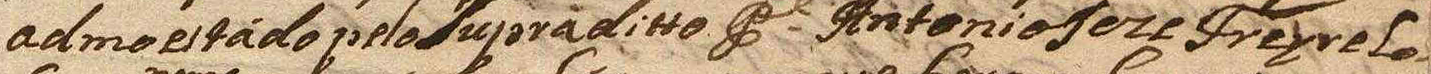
admoestádo pelo Supraditto P.e Antonio Joze Freyre Lo
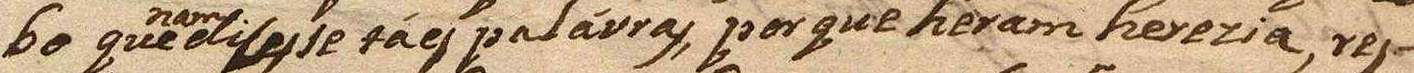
bo que nam dicesse táes paLávras, porque heram herezia, res
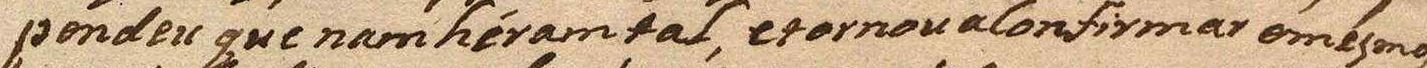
podeu que nam héram taL, e tornou a Confirmar o mesmo,
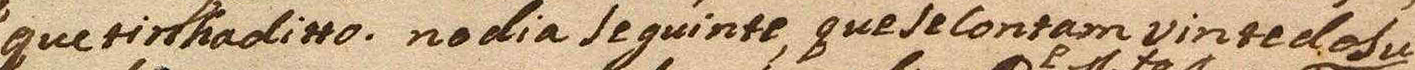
que tinha ditto. no dia seguinte, que se contam vinte do su
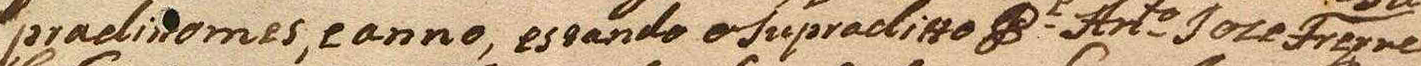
praditto mes, e anno, estando o supraditto P.e Anto. Ioze Freyre
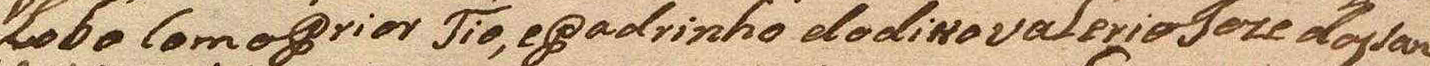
Lobo Com o Prior Tio, e Padrinho do ditto vaLerio Ioze dos san
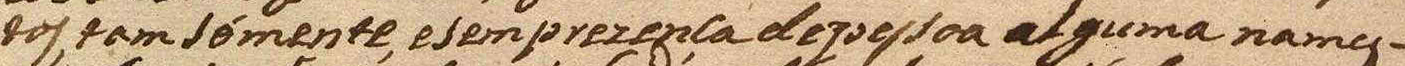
tos, tam sómente, e sem prezença de pessoa aLguma na mes
